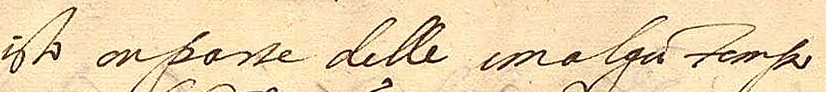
isto ou parte delle em algū tempo
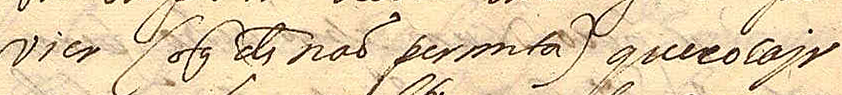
vier (o q̄ d̄s naõ permita) quero cajr
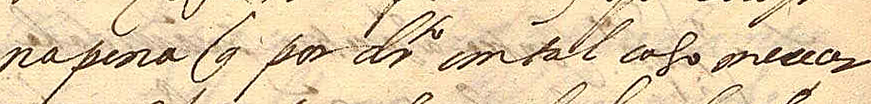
na pena q̄ por drto em tal caso merecer
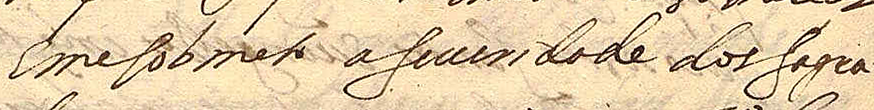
E me sobmeto a seueridade dos sagra
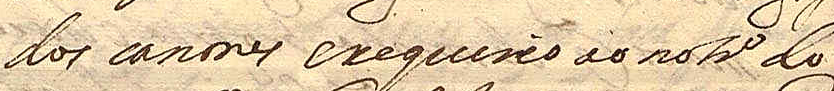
dos canones E requeiro ao notro do
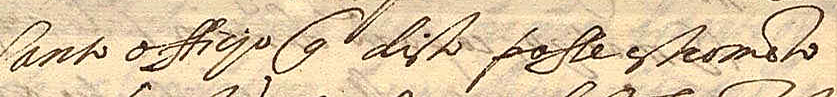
santo officjo q̄ disto passe estromēto
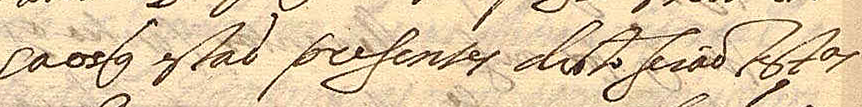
E aos q̄ estaõ presentes disto seiaõ testas
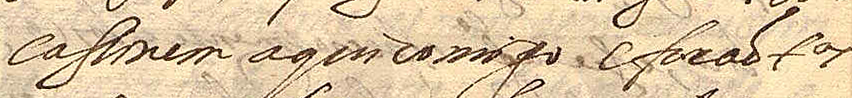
e assinem aqui comigo e foraõ tas
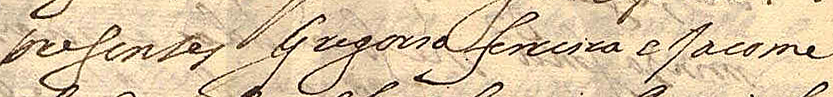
presentes Gregorio ferreira e Jacome
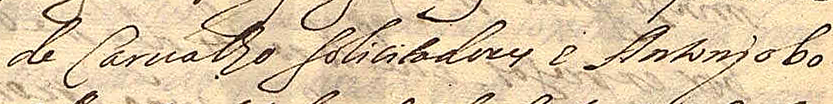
de Carualho solicitadores e Antonjo bo
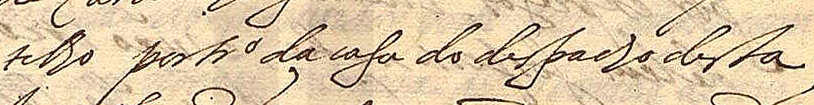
telho portro da casa do despacho desta
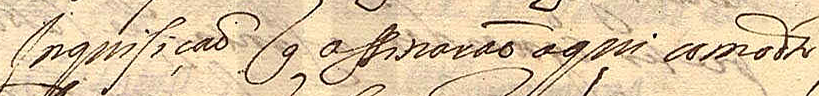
Jnquisiçaõ q̄ assinarão aqui com o dt̄o
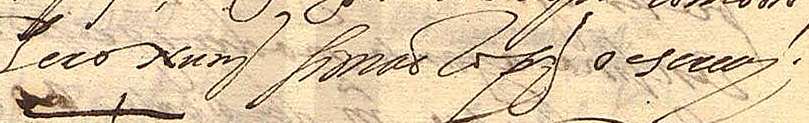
Pero Nunz̄ simaõ Lopz̄ o escreuj.
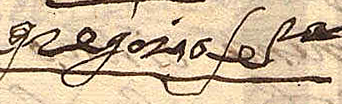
gregorio fera
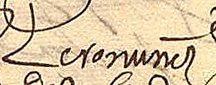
Pero nunez
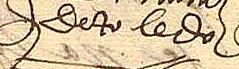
de toledo
